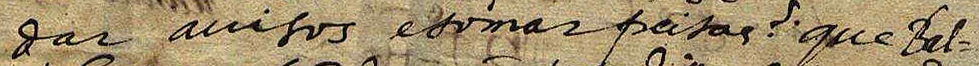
dar auisos e tomar peitas? que Bal
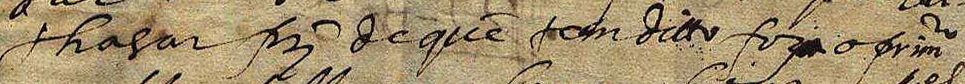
thasar frz̄ de quē tem ditto fora o primro
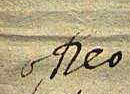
o Reo
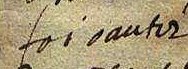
foi o autor
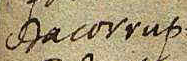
da corrup
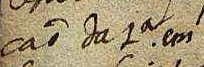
çaõ da ta. em
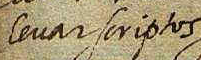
leuar scriptos
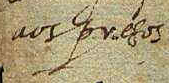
aos presos
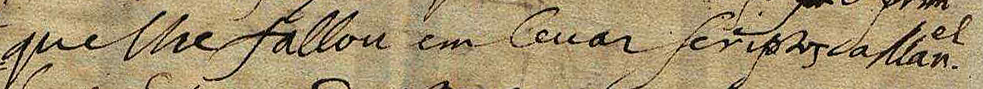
que lhe fallou em leuar scriptos a Man.el
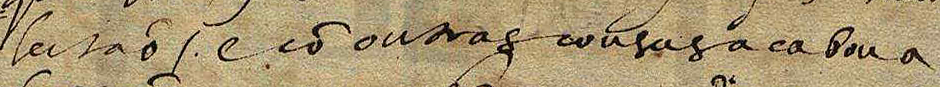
leitaõ /. e cō outras cousas acabou a
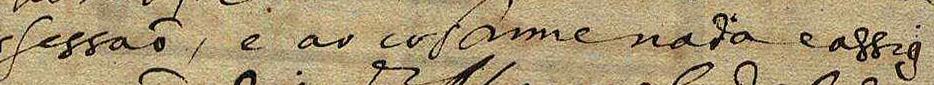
sessão, e ao costume nada e assig
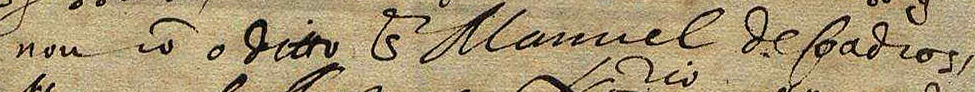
nou co̅ o ditto sor Manuel de Coadros,
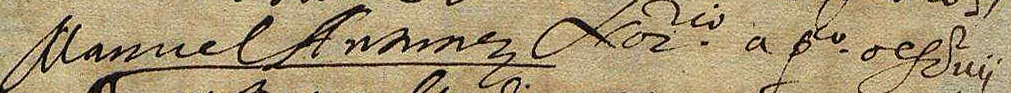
Manuel Antunez Not.rio apco. o esc̄uy
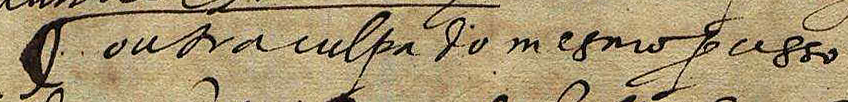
⁋ outra culpa do mesmo ꝓcesso
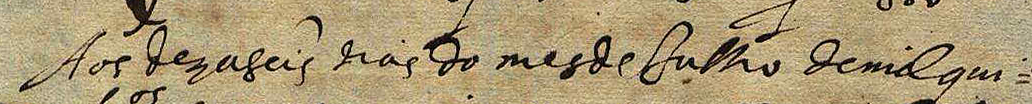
Aos dezaseis dias do mes de Julho de mil qui
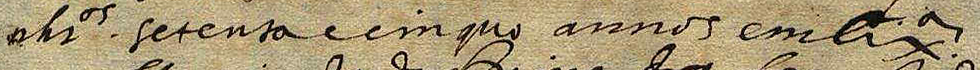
nhtos. setenta e cinquo annos em lixa.
